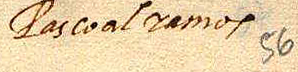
Pascoal ramos
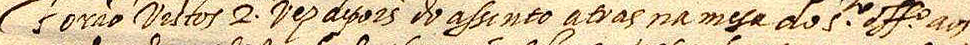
Forão vistos 2.a vez depois do assunto atras na mesa do s.to off.o aos
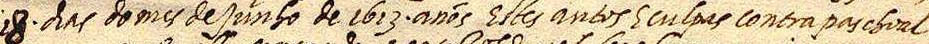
18 dias do mes de Junho de 1613 anōs Estes autos E culpas contra paschoal
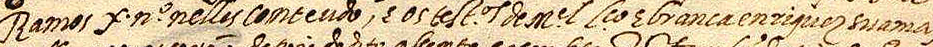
Ramos x. n.o nelles conteudo, E os test.os de Mel L.ço E branca enriquez sua maj
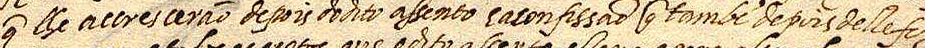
q̄ lhe accrescerão depois do dito assento E a confissão q̄ tambē depois delle fez
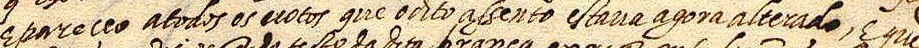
E pareceo a todos os uotos que o dito assento estaua agora alterado, E que
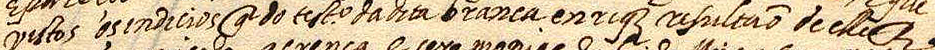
vistos os indicios que do test.o da dita branca enriq̄z resultaõ de elle Reo
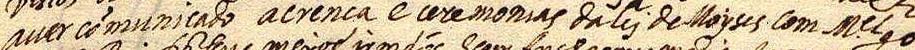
auer cōmunicado a crença e ceremonias da lej de Moyses com Mel go
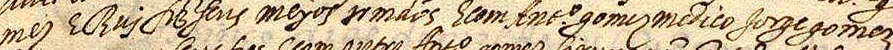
mez E Ruj frz̄ seus meyos irmaõs E com Ant.o gomez medico Jorge gomez
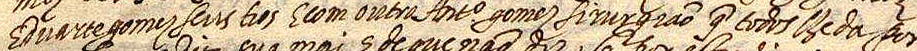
E duarte gomez seus tios E com outro Ant.o gomez sirurgião q̄ todos lhe da por
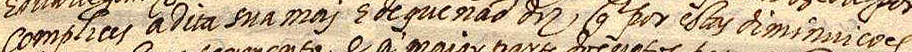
complices a dita sua maj E de que não diz, q̄ por estas diminuiçoes
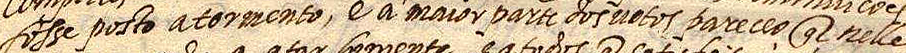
fosse posto a tormento, e a maior parte dos uotos pareceo q̄ nelle
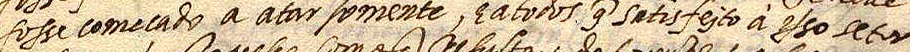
fosse começado a atar somente, E a todos q̄ satisfeito à isso se tor
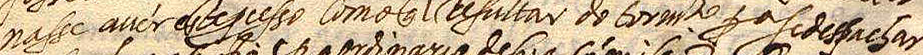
nasse auer este ꝓcesso como q̄ resultar de torm.to ꝑa se despachar
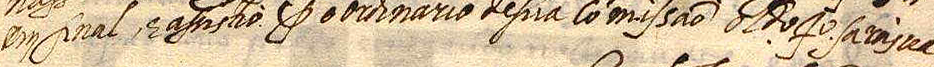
em sinal, E assistio p̄o ordinario de sua comissão o Ldo Jo. Sarajua
